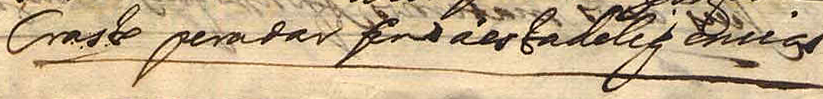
Crasto pera dar fim a esta deligencia
